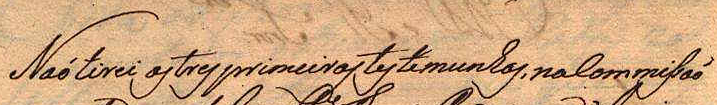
Naõ tirei as tres primeiras testemunhas, na Commissaõ
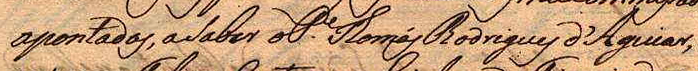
apontadas, a Saber o P.e Thomás Rodrigues d'Aguiar,
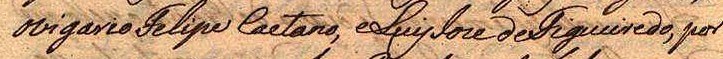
o vigario Felipe Caetano, e Luis Ioze de Figueiredo, por
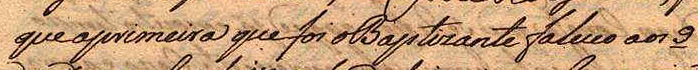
que a primeira que foi o Baptizante faleceo aos 9
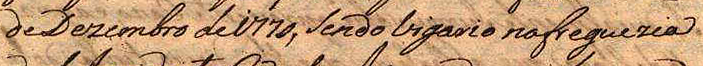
de Dezembro de 1770, sendo Vigario na freguezia
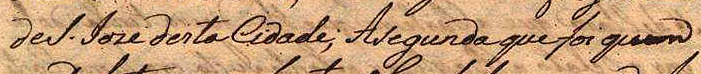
de S. Ioze desta Cidade; A segunda que foi quem
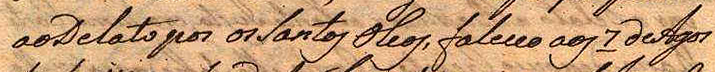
ao Delato pos os Santos Oleos, faleceo aos 7 de Agos
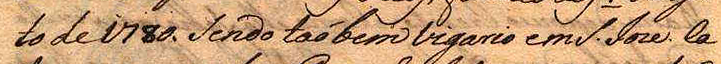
to de 1780. sendo taõbem vigario em S. Ioze. E a
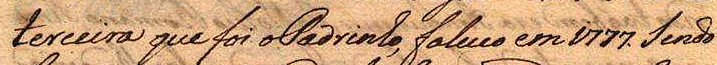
terceira que foi o Padrinho, faleceo em 1777. sendo
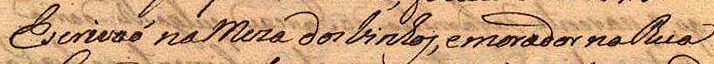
Escrivaõ na Meza dos Vinhos, e morador na Rua
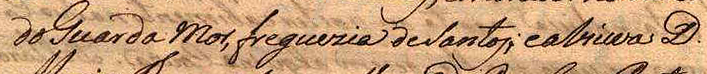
do Guarda Mor, freguezia de Santos; e a viuva D.
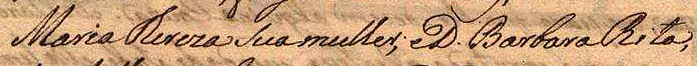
Maria Thereza sua mulher; e D. Barbara Rita,
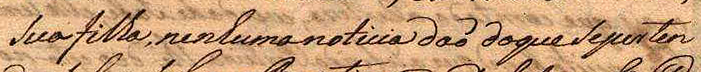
sua filha, nenhuma noticia daõ do que se perten
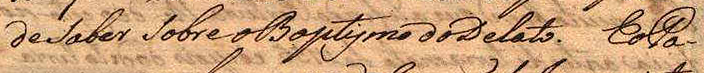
de saber sobre o Baptismo do Delato. E o Pa
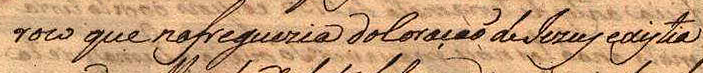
roco que na freguezia do Coraçaõ de Iezus existia
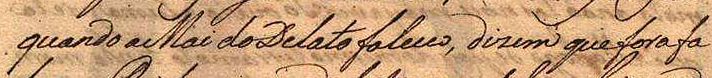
quando a Mai do Delato faleceo, dizem que fora fa
